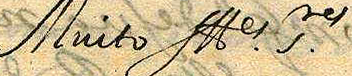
Muito Jl̄les. s.res
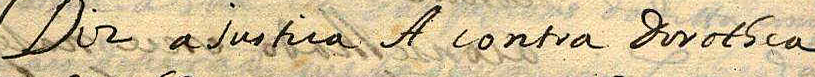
Diz a Iustica A contra Dorothea
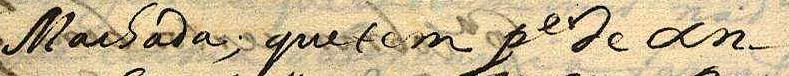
Machada; que tem pe de xn.
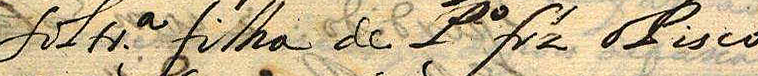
soltr.a filha de Po frz̄ o Pisco
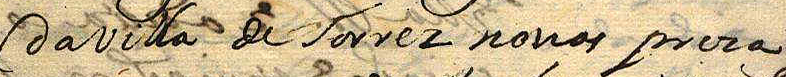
da villa de Torrez nouas preza
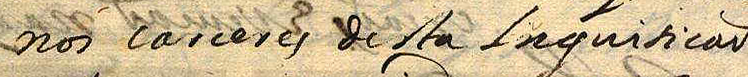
nos carceres desta Inquisicaõ
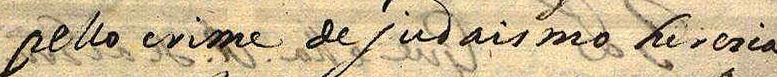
pello crime de judaismo herezia
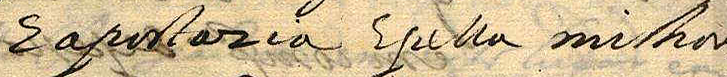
E apostazia E pella milhor
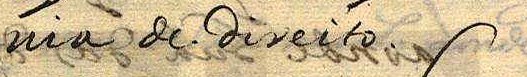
uia de direito
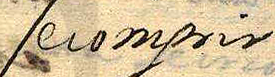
Se comprir
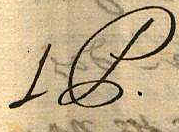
1 P.
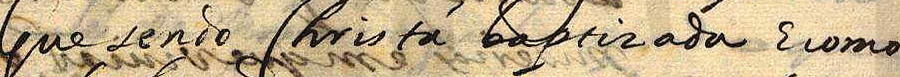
Que sendo Christā baptizada E como
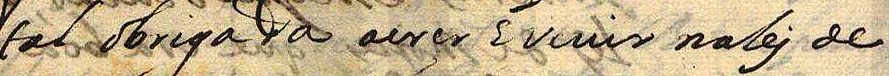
tal obrigada a crer E veuir na lej de
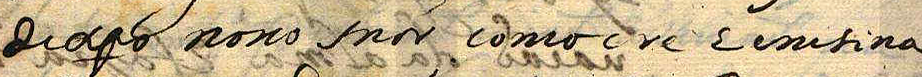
de xpo nosso snor̄ como cre E emsina
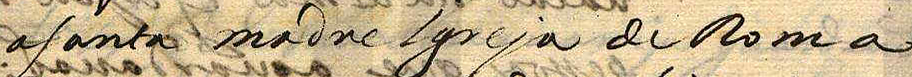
a Santa madre Igreja de Roma
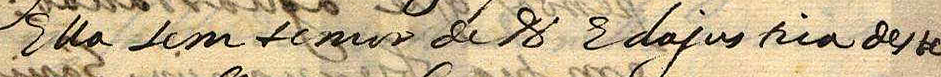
Ella sem temor de ds E da justica deste
